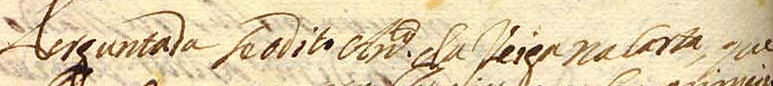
Perguntada se o dito Anto a Veiga na Carta, que
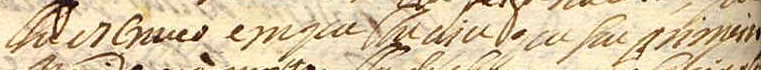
lhe escreueo em que lhe dice que seu primeiro
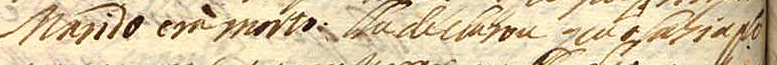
Marido era morto: lhe declarou que o sabia p.lo
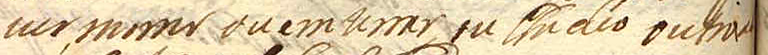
uer, morrer ou emterrar, ou lhe deo outro al
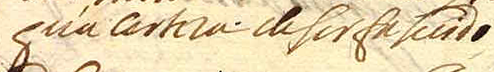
gua certeza de ser falecido
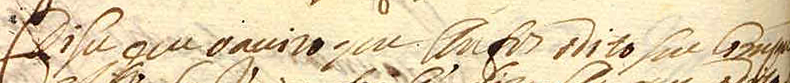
Disse que o auizo que lhe fes o dito seu Comp
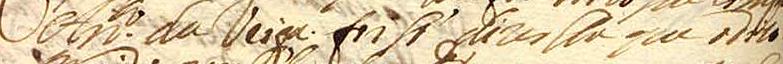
An.to da Veiga foi só dizerlhe que o dito
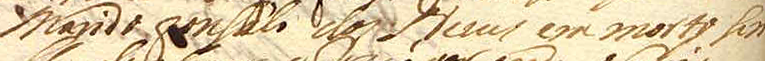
marido gonsalo das Neues era morto sem
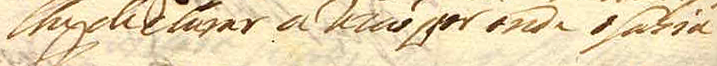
lhe declarar a Rezaõ por onde o sabia
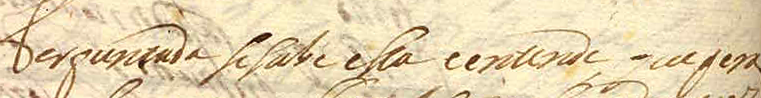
Perguntada se sabe essa e entende que pera
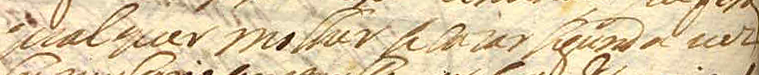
qualquer molher se cazar segunda uez
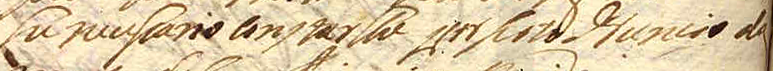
he necessario constarlhe por serto Nuncio da
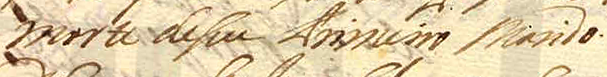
morte de seu Primeiro Marido
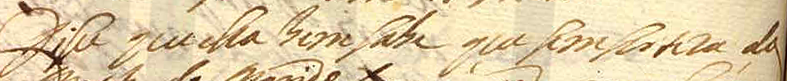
Disse que ella bem sabe que sem serteza da
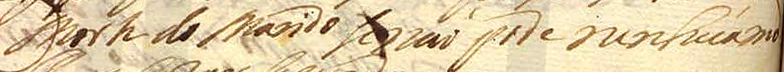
morte do Marido se naõ pode nenhuā mo
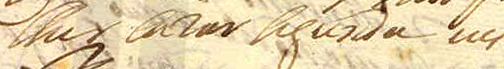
lher cazar segunda ues
